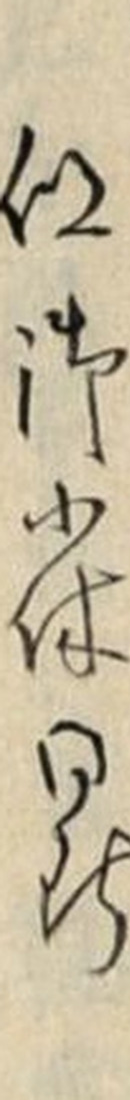但御小休同断
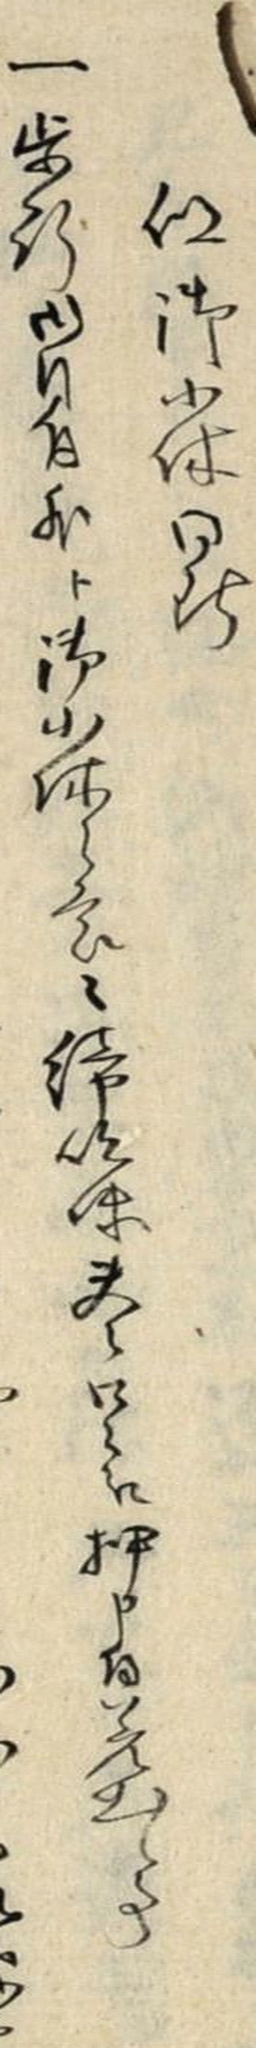一歩行御目付外と御小休之節々締吟味夫々口々江押申付差出候事
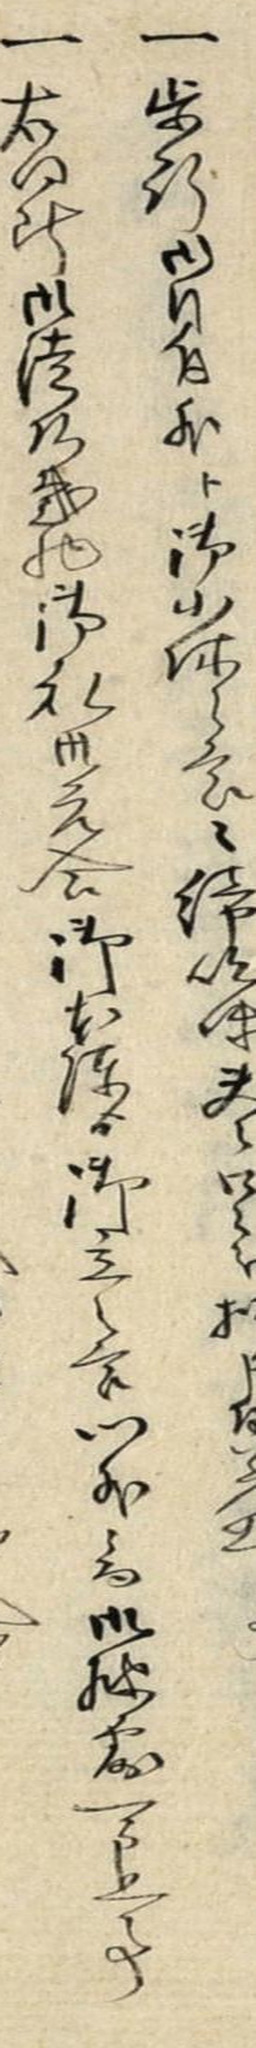一右同断御徒頂戴物御礼御元合御本陣ゟ御立之節門外にて御披露可申上事
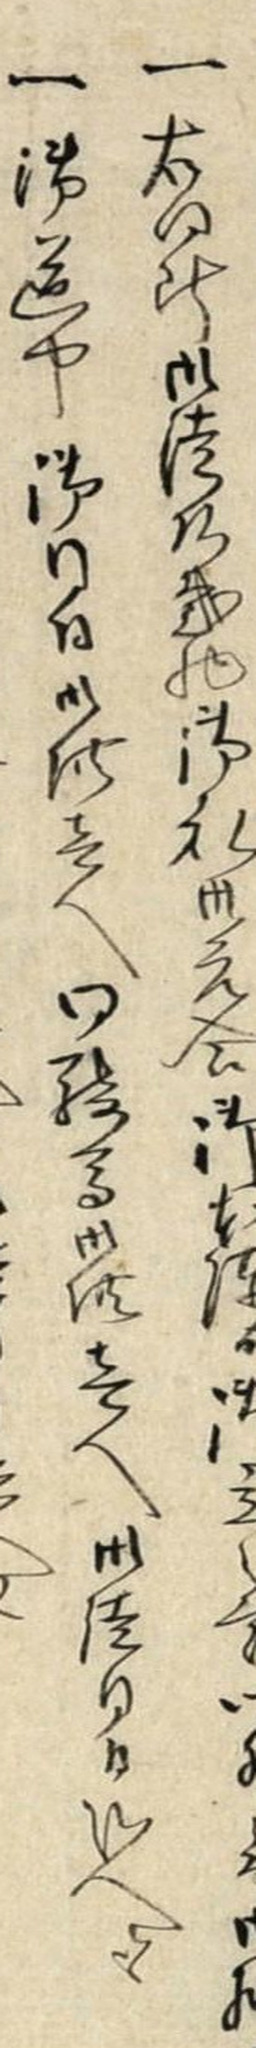一御道中御目付御供壱人同駿馬御供壱人御徒目付弐人ツヽ
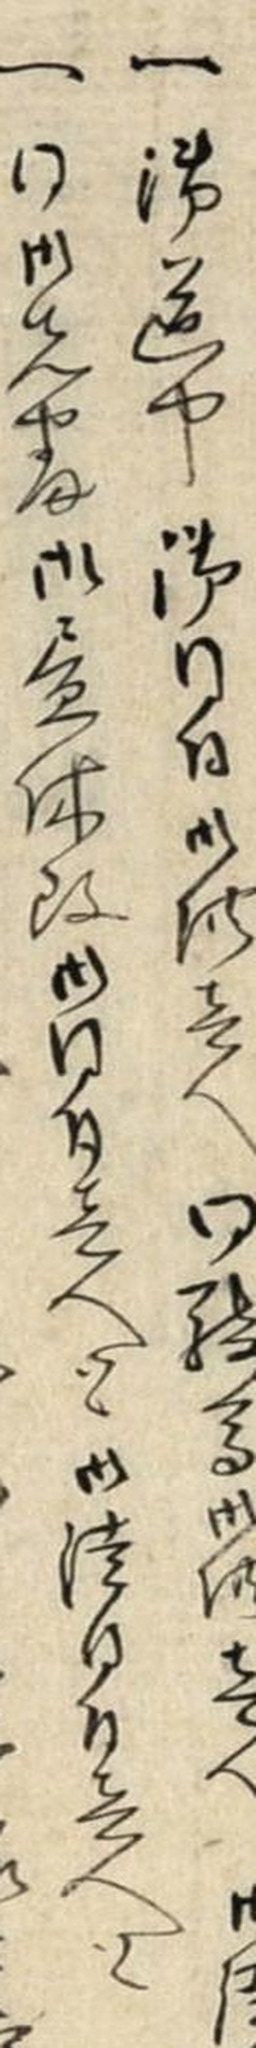一同御先番御昼休改御目付壱人ツヽ御徒目付壱人ツヽ
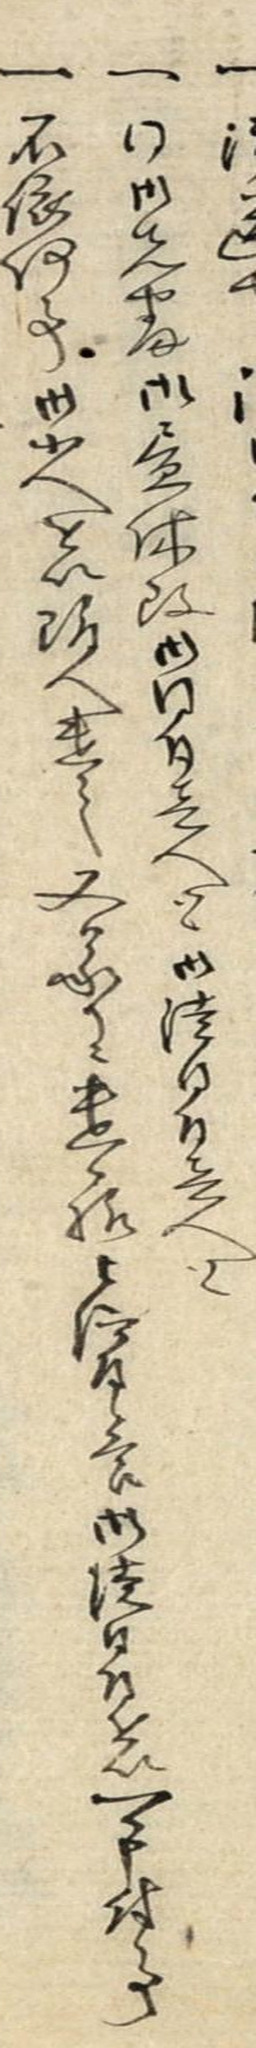一不依何事御小人を以附人遣之又は承りに遣候様被仰付候節御徒目付を以可申付事
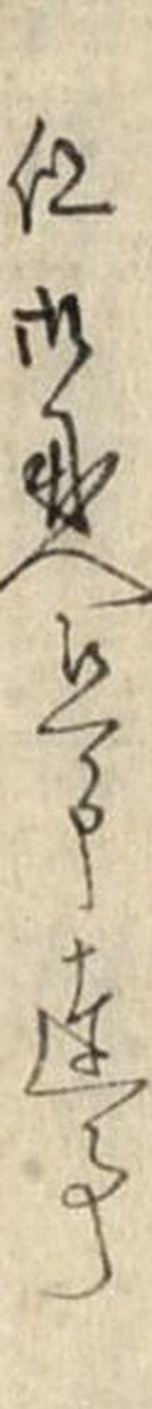但御用人江可申達事
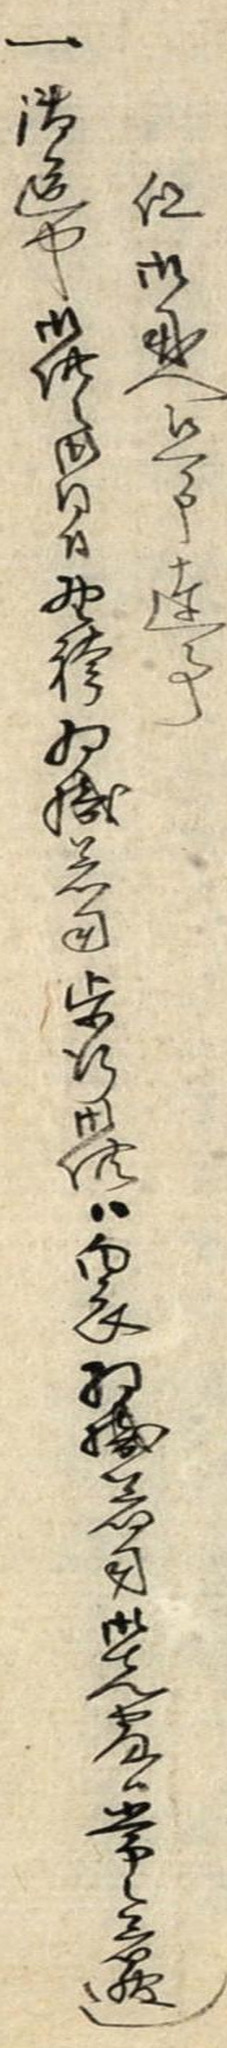一御道中御供之御目付野袴羽織着用歩行御供は白衣羽織着用御先番は常之着服也

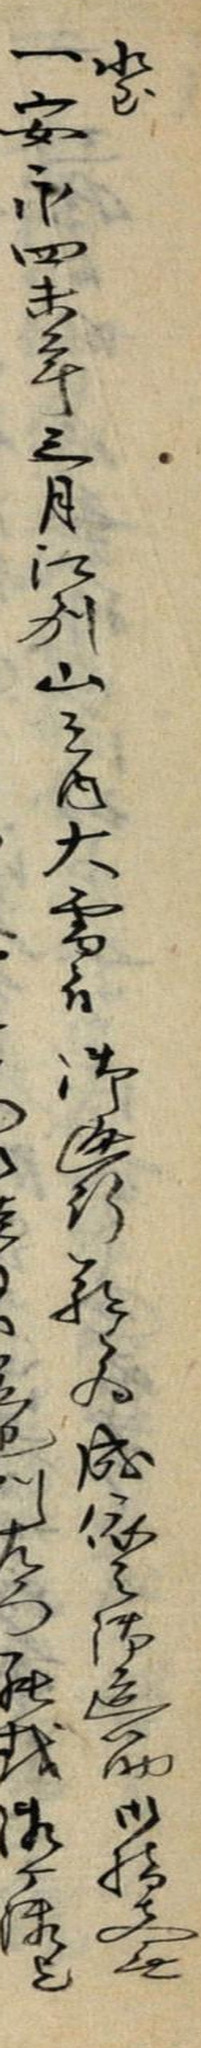一安永四未年三月江州山之内大雪に付御通行難被為成依之御道筋御指支無
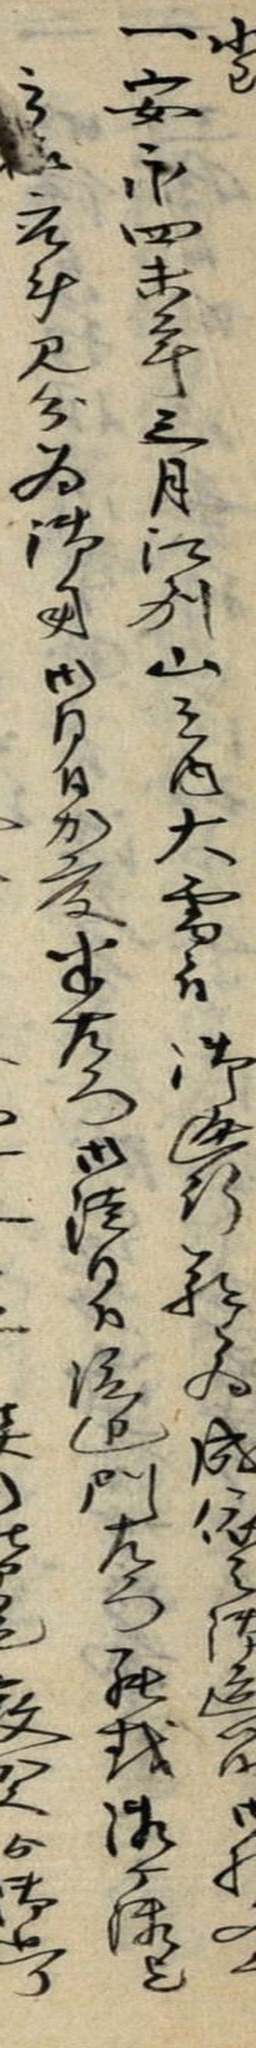之様取計見分為御用御目付加藤半左衛門御徒目付渡辺門左衛門罷越ヶ瀬迄
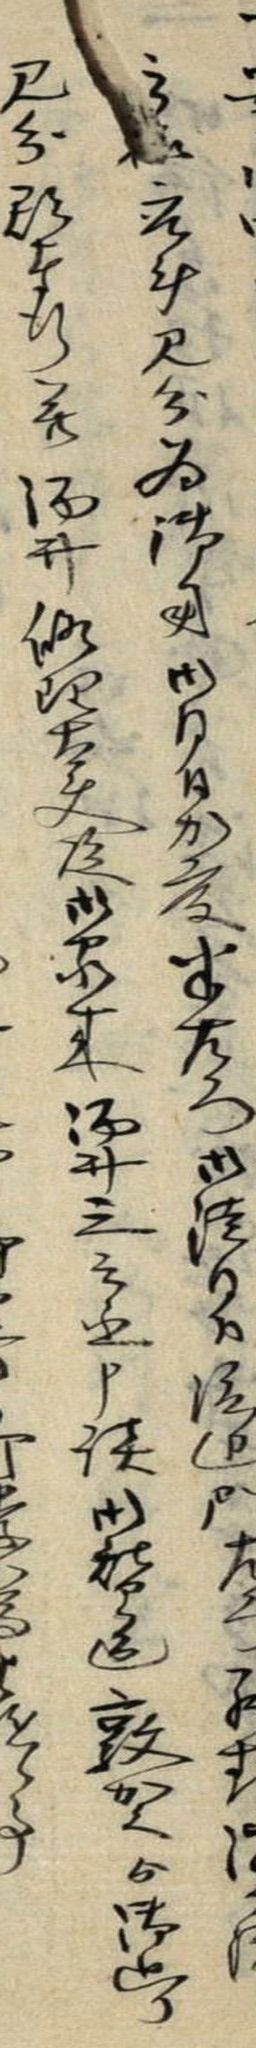見分郡奉行并酒井修理太夫殿御家来酒井三之丞申談御替道敦賀ゟ御廻り
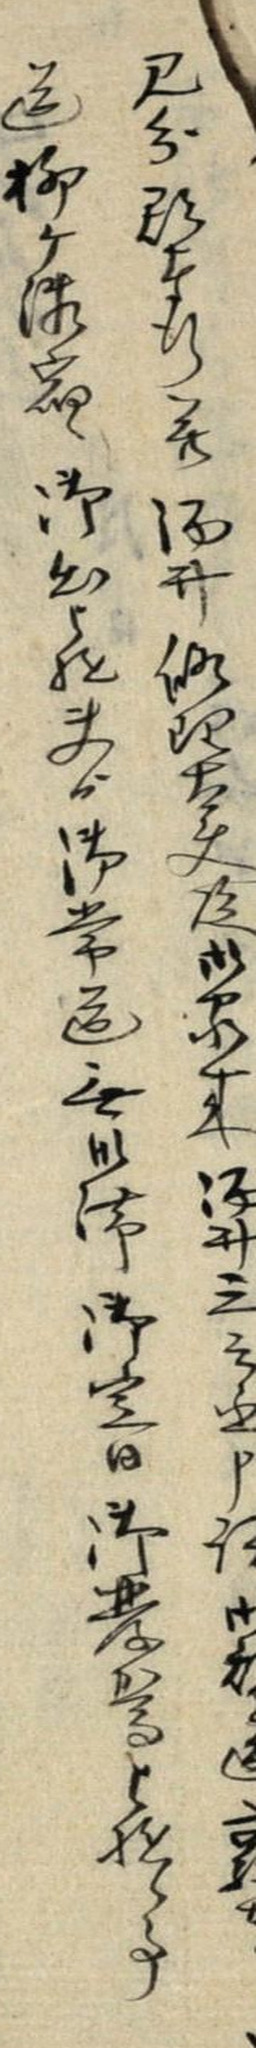道柳ケ瀬宿へ御出被遊夫ゟ御常道無御滞御定日御発駕被遊候事
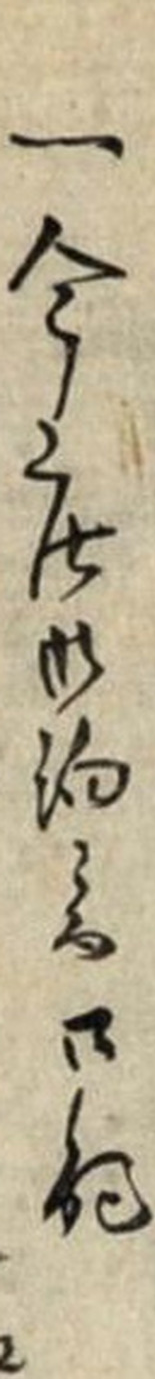一今庄御泊にて御触
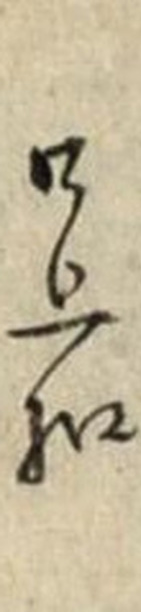口上扣
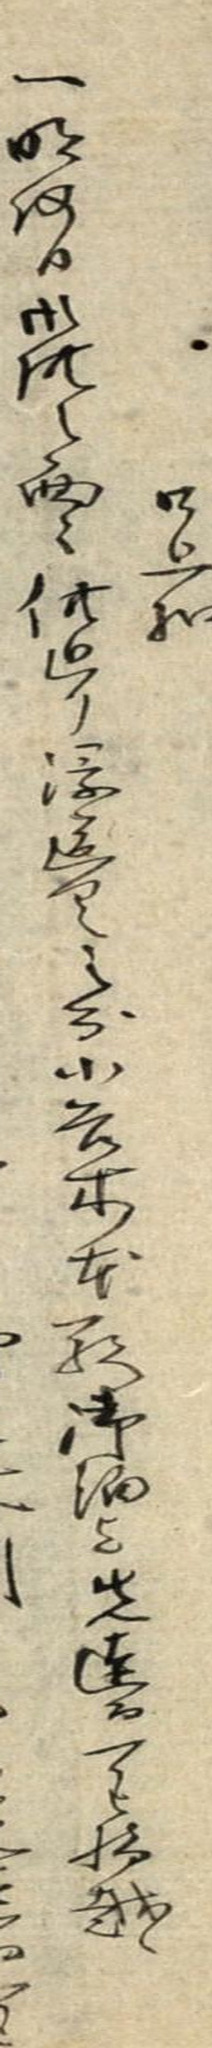一明何日御供之面々供廻り浮道具之分小谷木本駅御泊迄先達て可被指越候
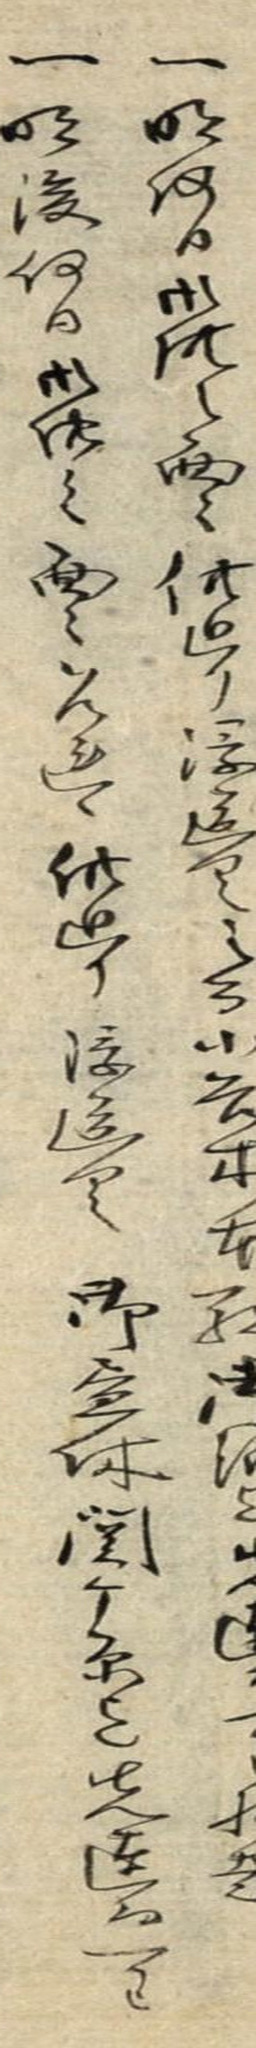一明後何日御供之面々召連候供廻り浮道具御昼休関ヶ原迄先達て可被
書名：三都并道中之部
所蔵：福井県文書館 Fukui Prefectural Archives
